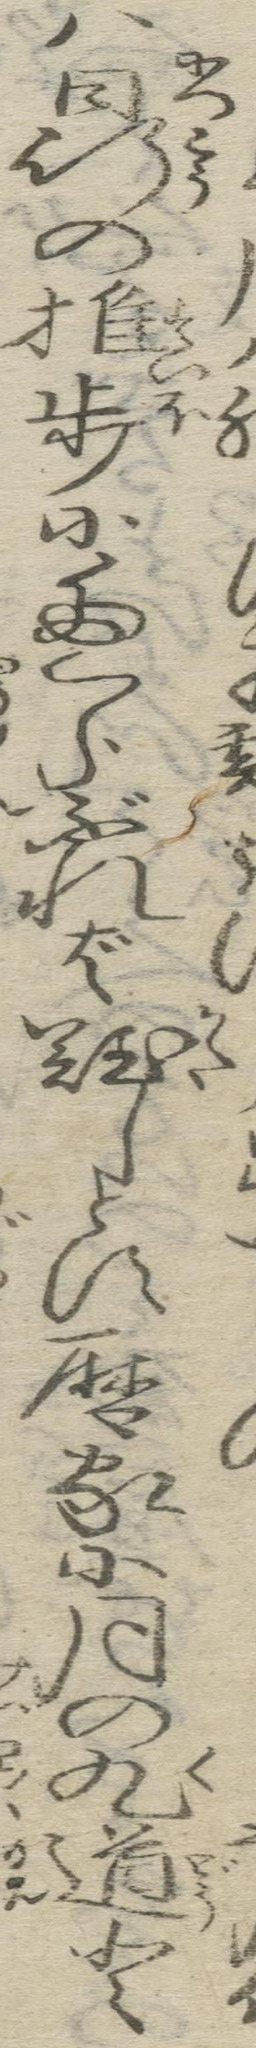は日行の推歩にたくらぶれば難しとす暦家に月の九道と
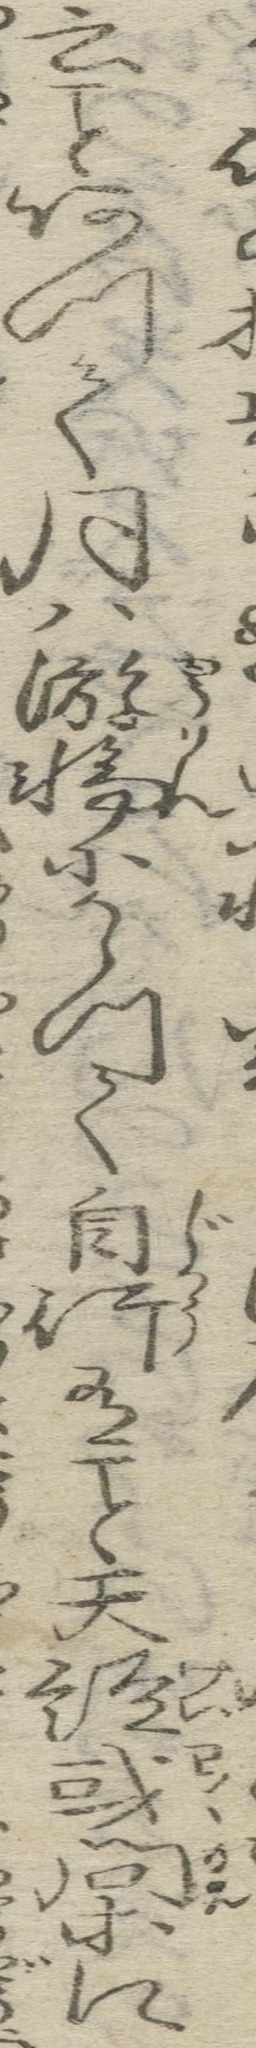云ことあつて月は游輪にかゝつて自行有こと天経或問等に
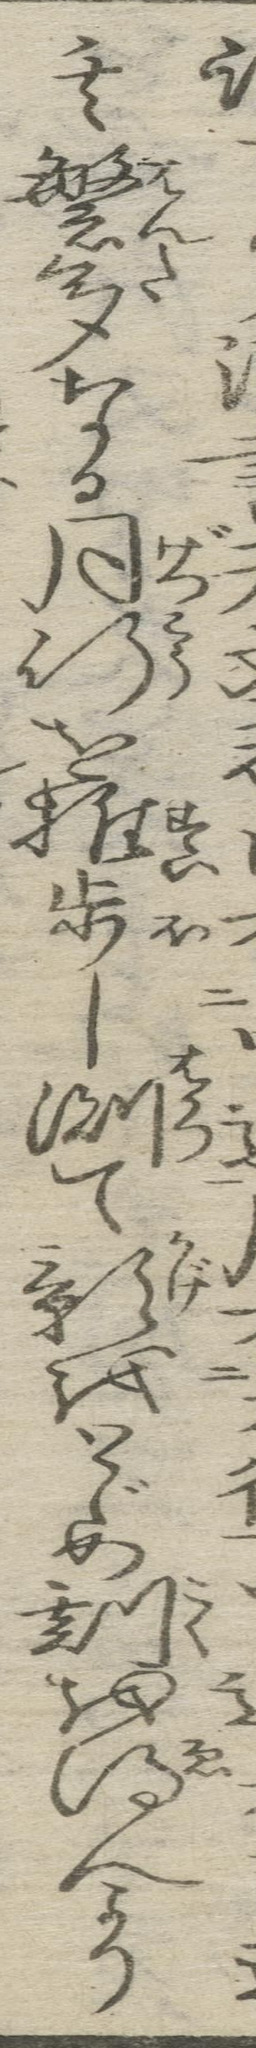其繁多なる月行を推歩し測て影をとゞめ刻を得んより
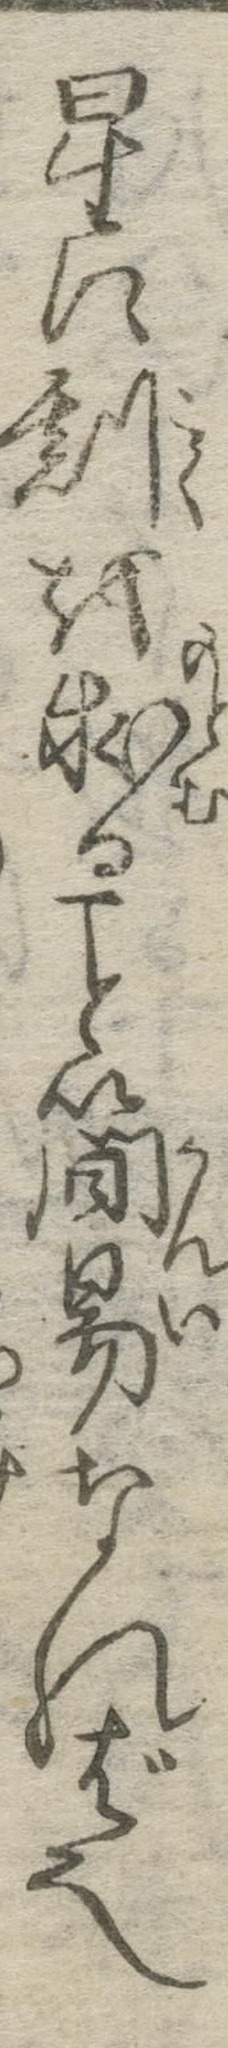星に刻を求ること簡易なれば也
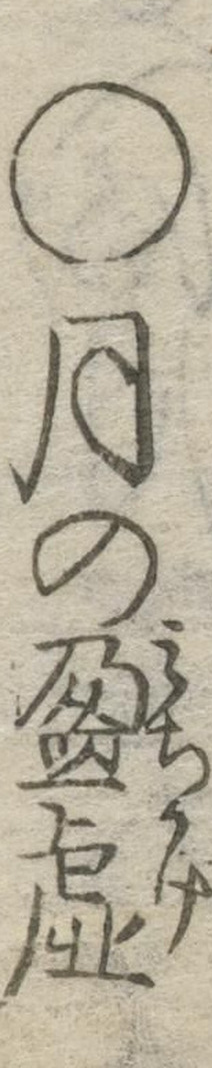○月の盈虚
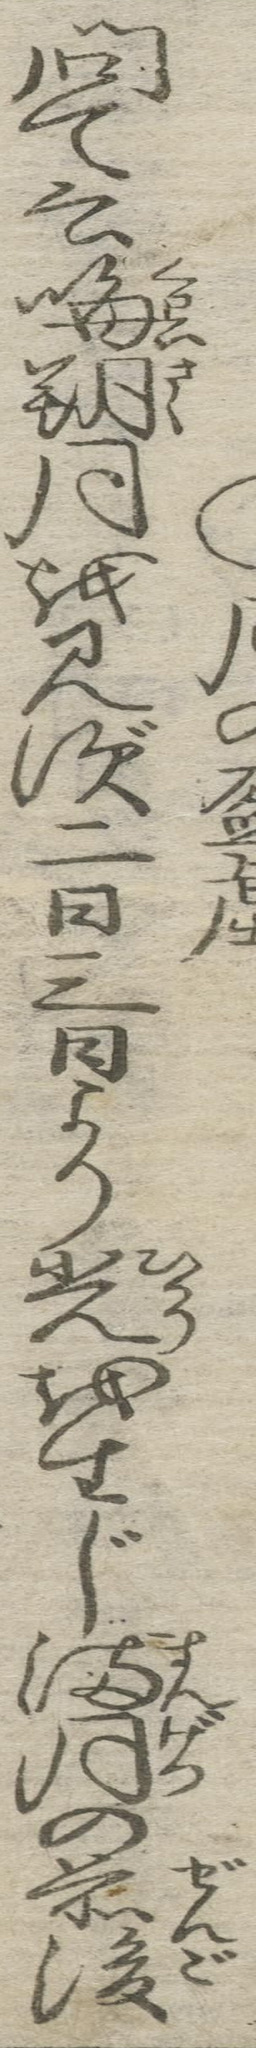問て云晦朔月を見ず二日三日より光を生じ満月の前後
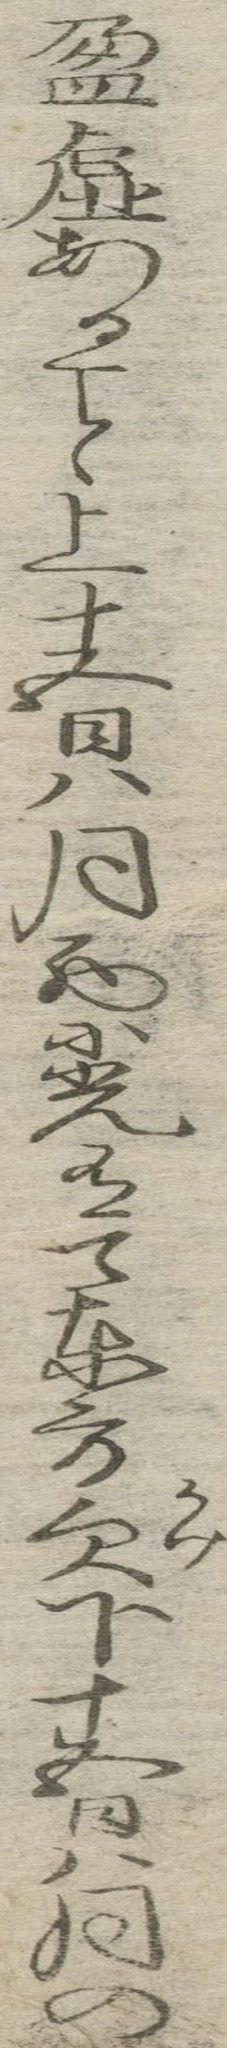盈虚あること上十五日は西に光有て東方欠下十五日は月の
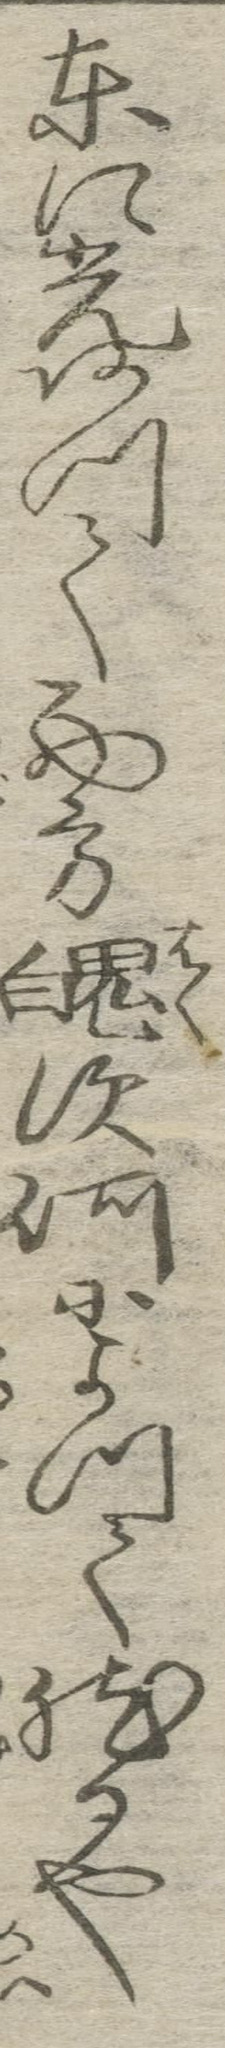東に光あつて西方魄す何によつて然るや
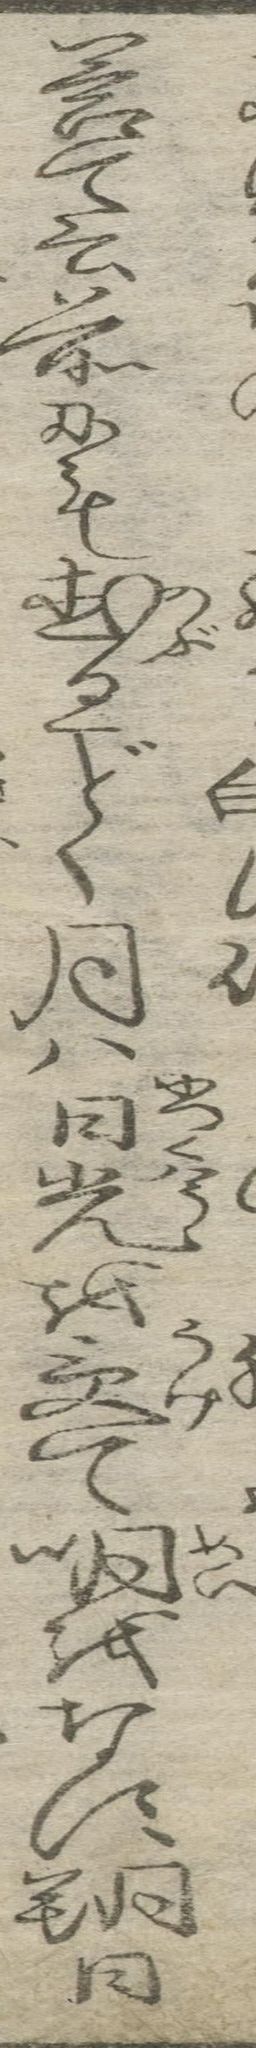答て云前にも述るごとく月は日光を受て明をなす朔日
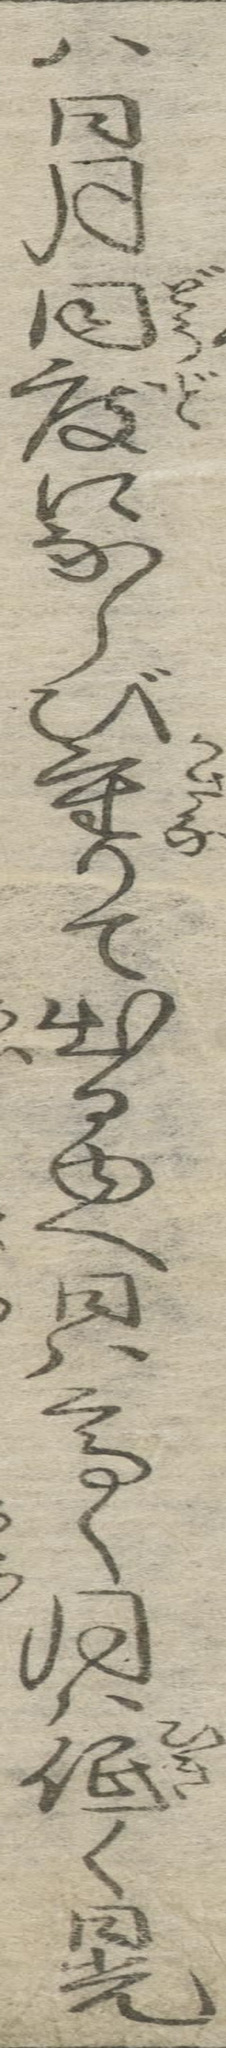は日月同度にならび重りて出るゆへ日は高く月は低く日光
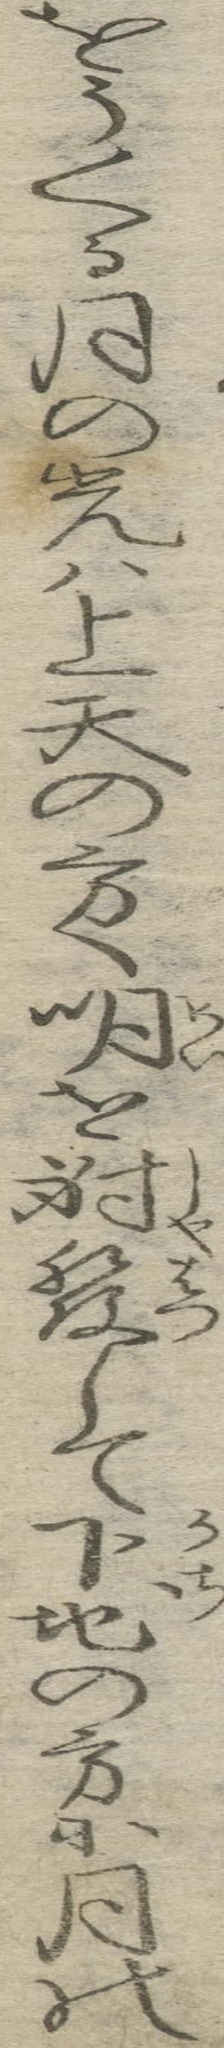をうくる月の光りは上天の方へ明を射発して下地の方に月の

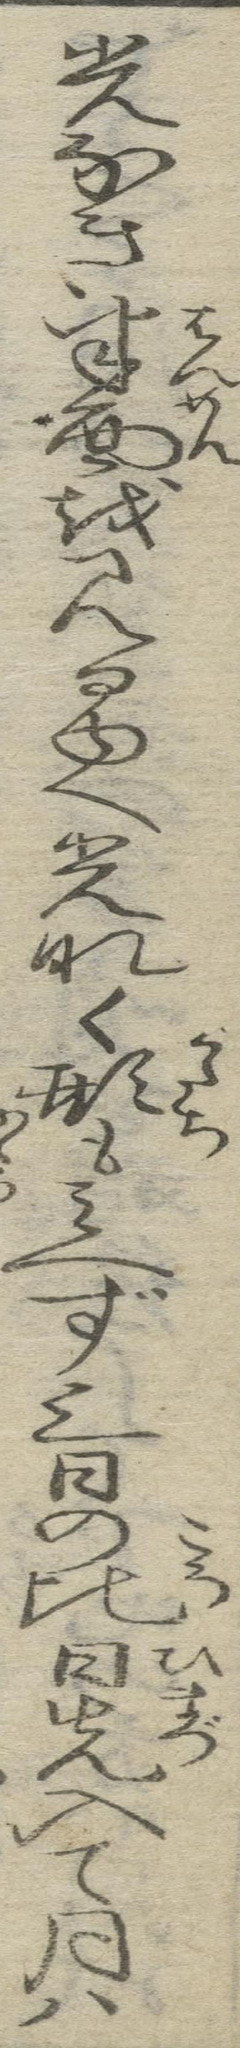光なき半面を見るゆへ光なく形もみへず三日の比日先入て月は
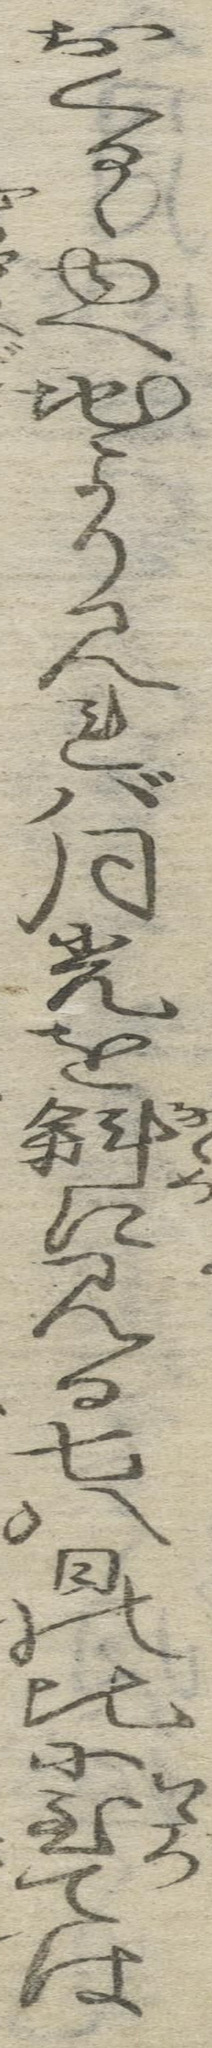おくるゝゆへ地より見れば月光を斜に見る七八日の日に至ては
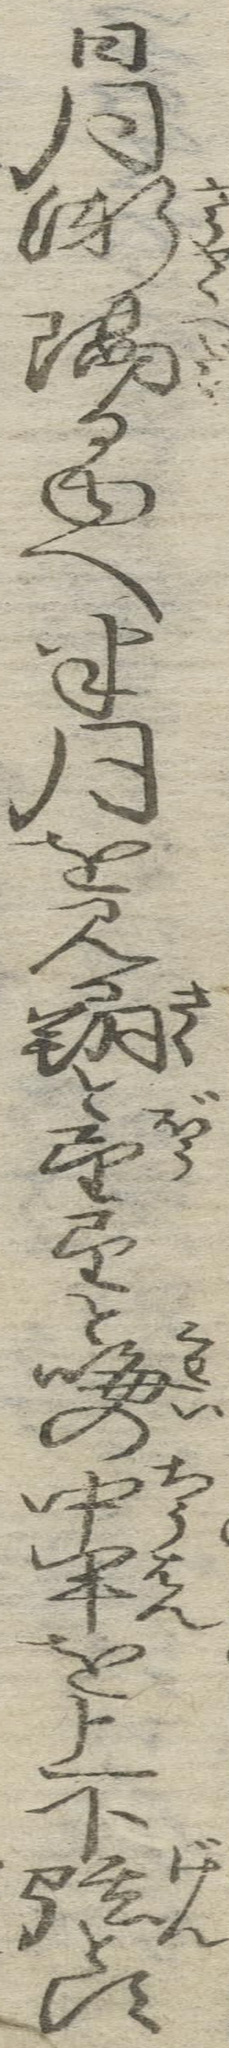日月漸隔るゆへ半月を見る朔と望望と晦の中半を上下弦とす
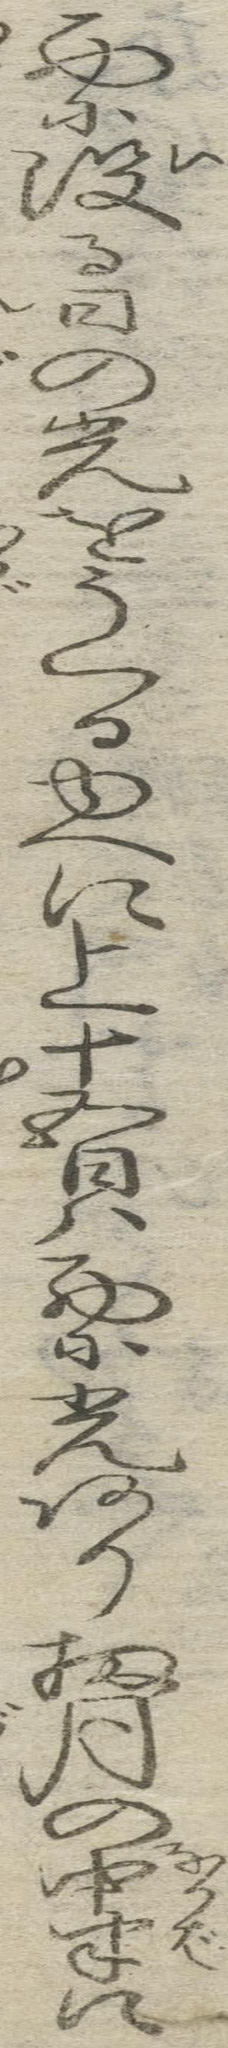西に没る日の光をうつるゆへに上十五日は西に光あり扨月の中半に
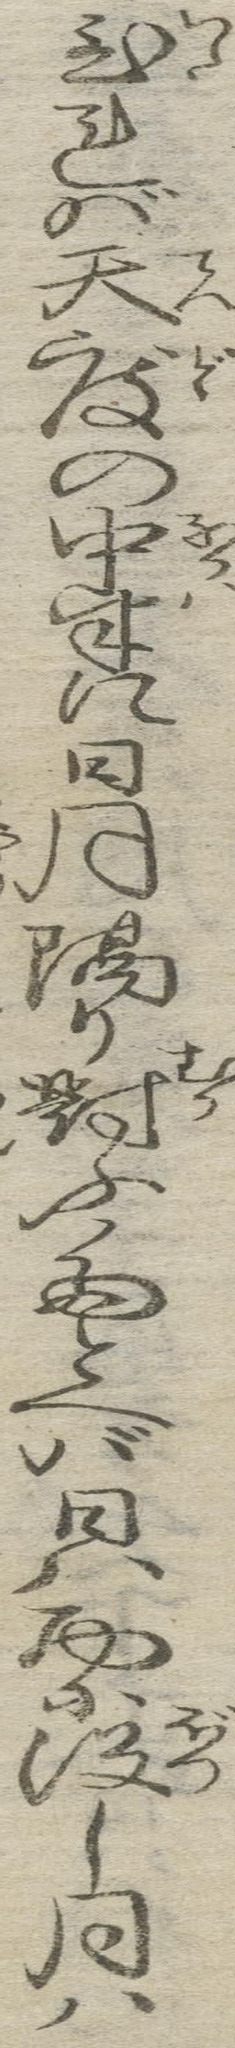至れば天度の中半に日月隔り対ふたとへば日は西に没し月は
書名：訓蒙天地辨　天
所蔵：東京大学地震研究所図書室 Earthquake Research Institute Library, The University of Tokyo, JAPAN
